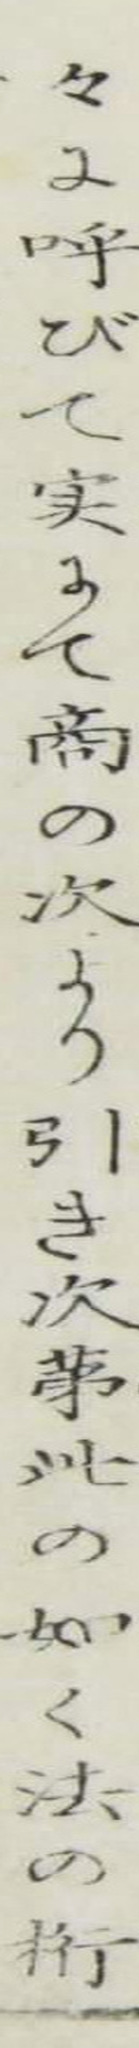々に呼びて実にて商の次より引き次第此の如く法の桁
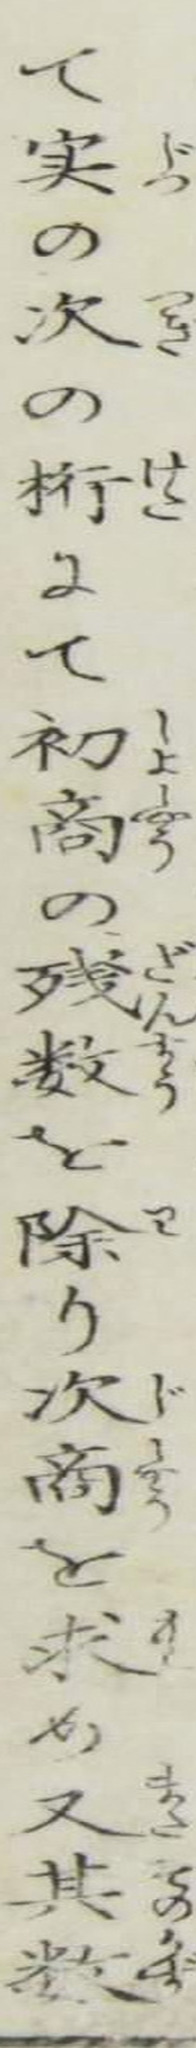て実の次の桁にて初商の残数を除り次商を求め又其数

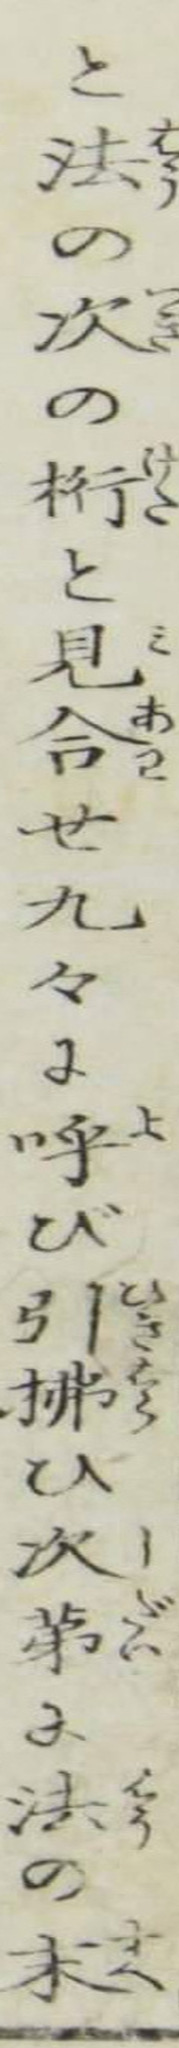と法の次の桁と見合せ九々に呼び引払ひ次第に法の末
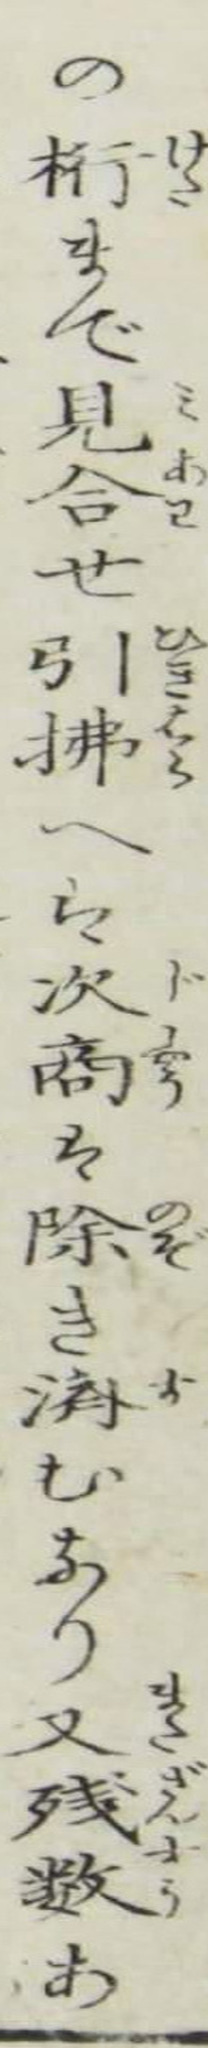の桁まで見合せ引払へは次商は除き済むなり又残数あ
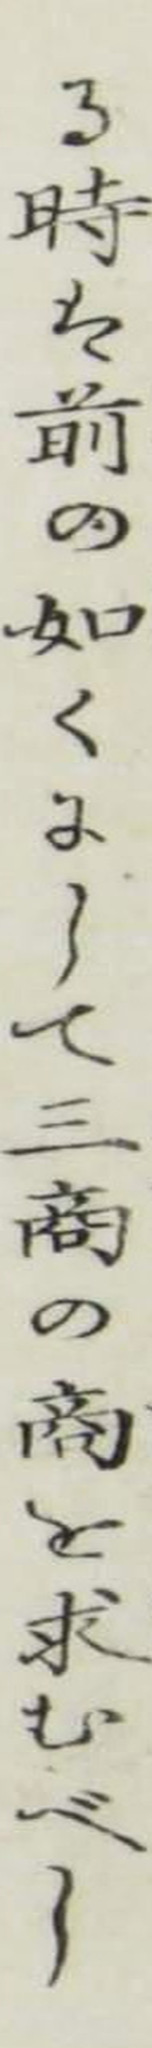る時は前の如くにして三商の商を求むべし
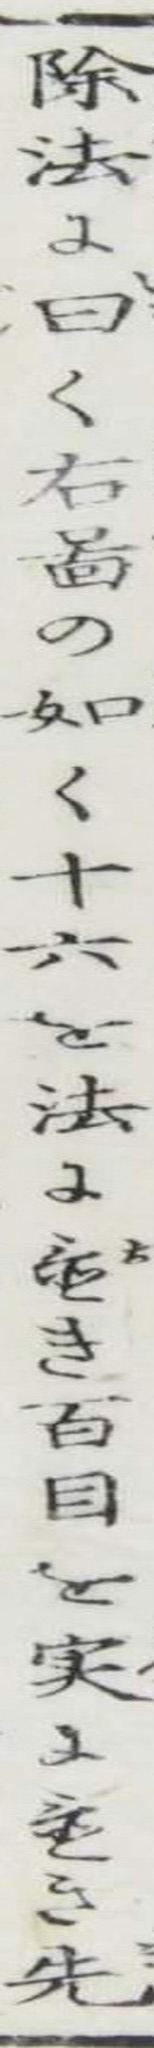除法に曰く右図の如く十六を法に置き百目を実に置き先
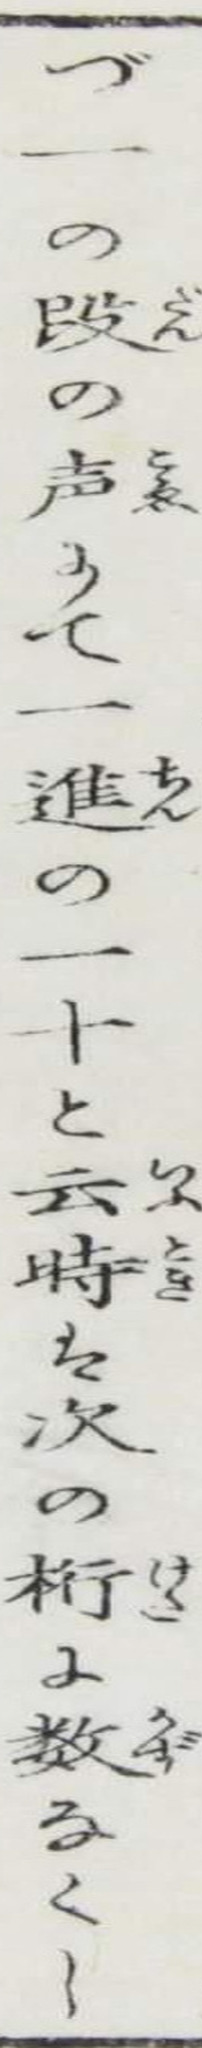づ一の段の声にて一進の一十と云時は次の桁に数なくし
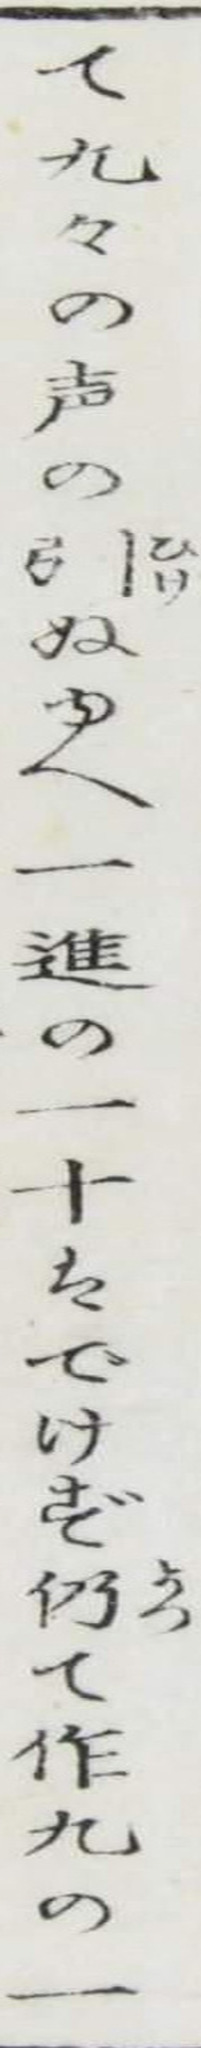て九々の声の引ぬゆへ一進の一十はでけず仍て作九の一
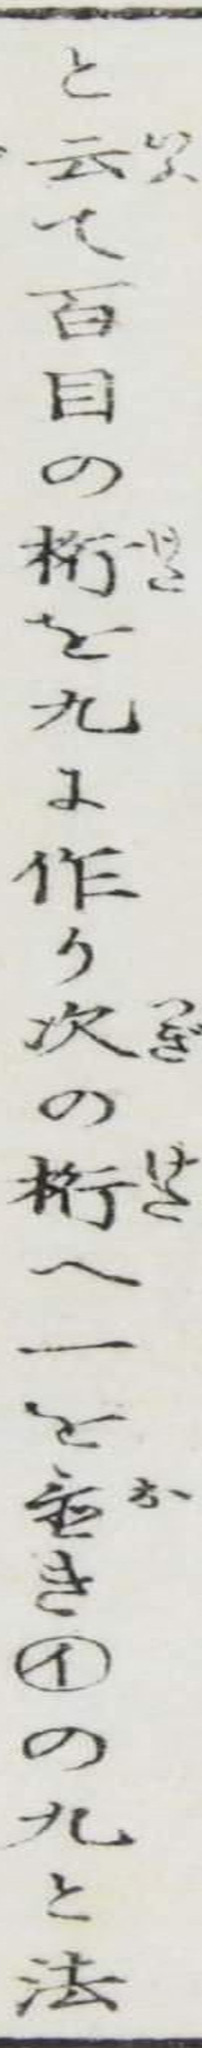と云て百目の桁を九に作り次の桁へ一を置き㋑の九と法
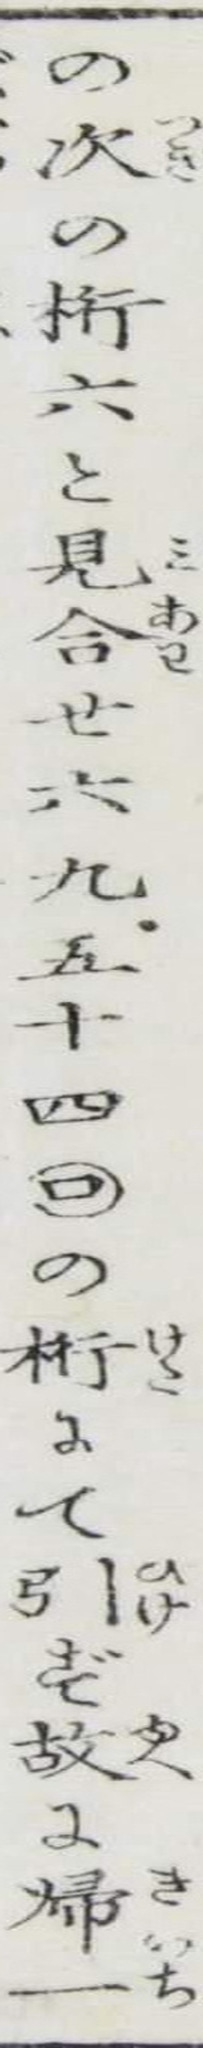の次の桁六と見合せ六九．五十四㋺の桁にて引ず故に帰一
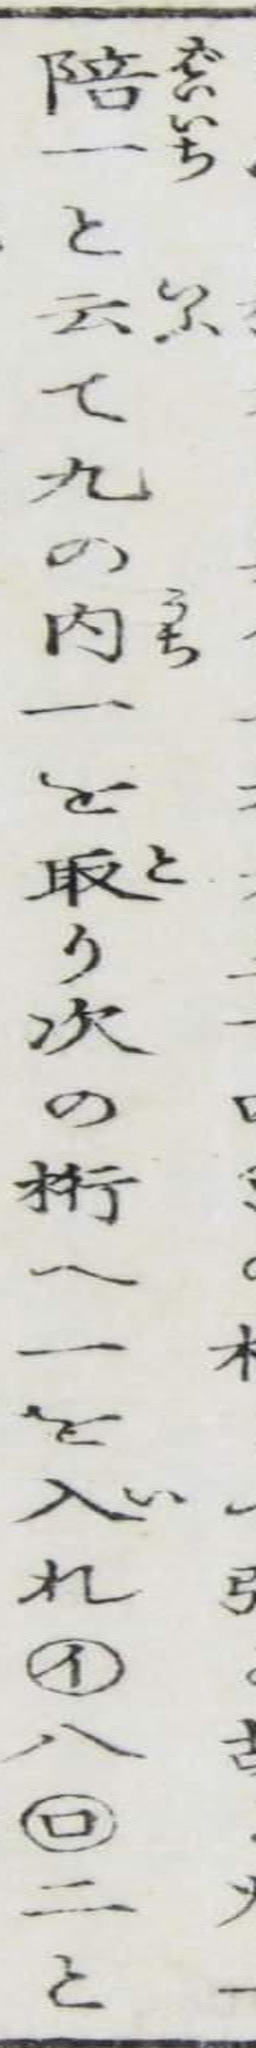賠一と云て九の内一を取り次の桁へ一を入れ㋑八㋺二と
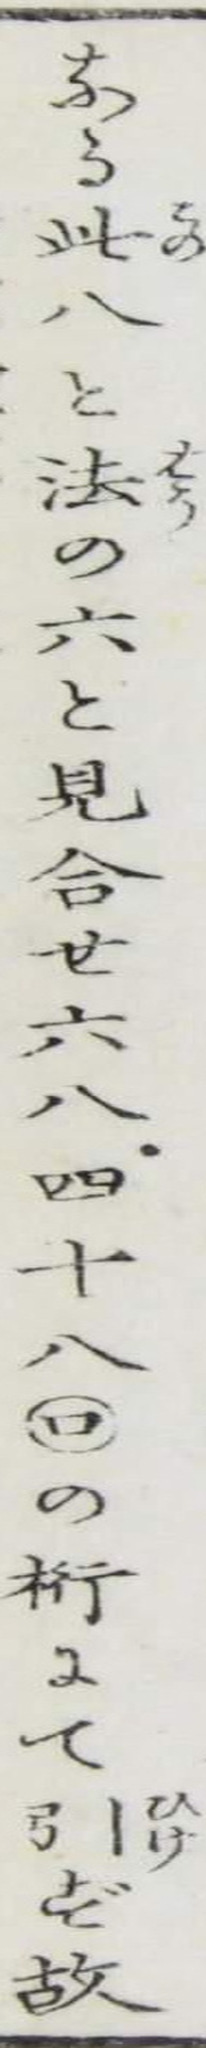なる此八と法の六と見合せ六八．四十八㋺の桁にて引ず故
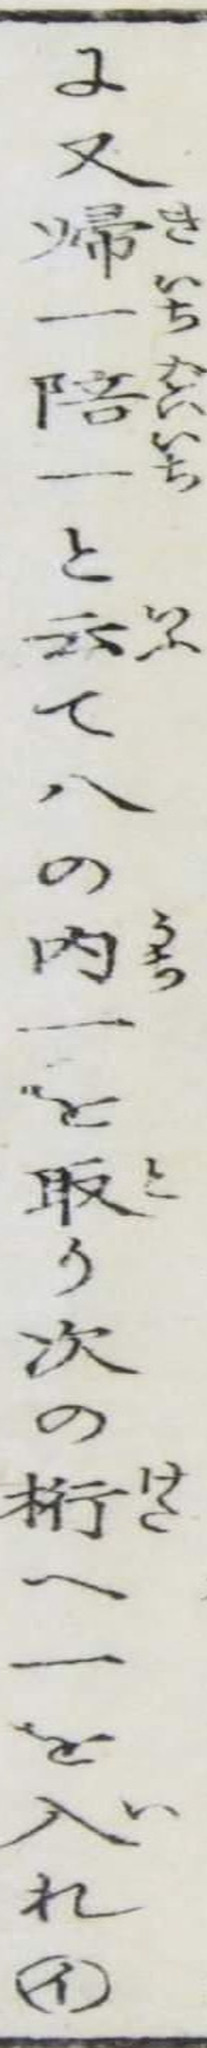に又帰一陪一と云て八の内一を取り次の桁へ一を入れ㋑
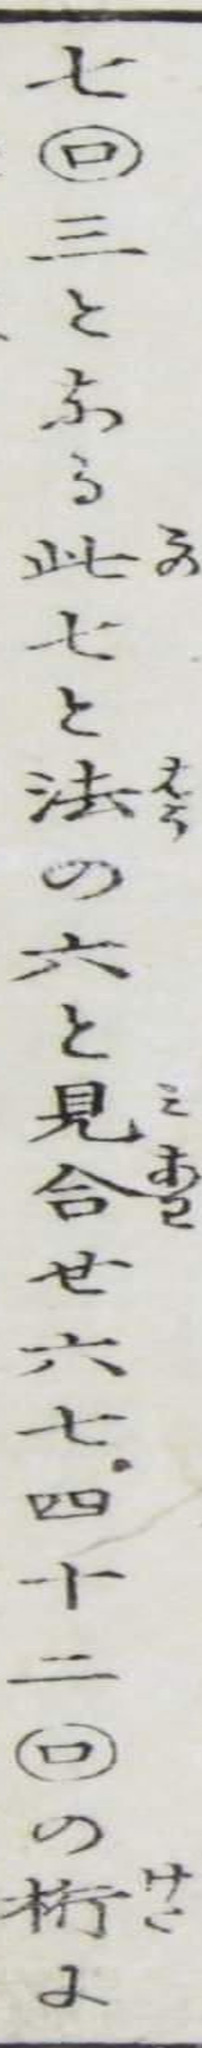七㋺三となる此七と法の六と見合せ六七．四十二㋺の桁に
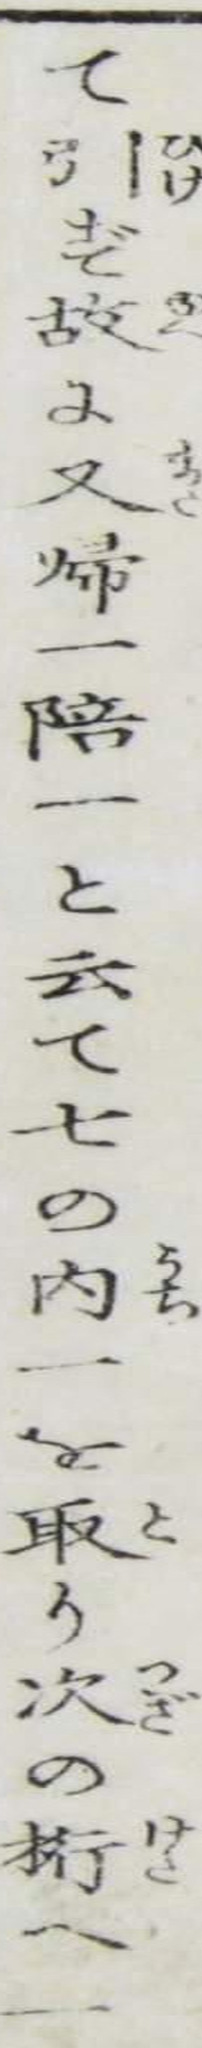て引ず故に又帰一陪一と云て七の内一を取り次の桁へ一
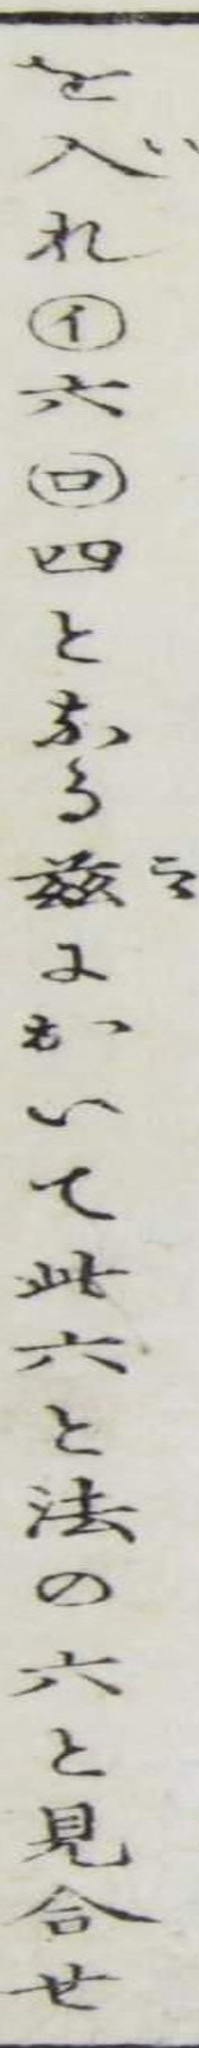を入れ㋑六㋺四となる茲において此六と法の六と見合せ
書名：明治小學塵劫記 卷1
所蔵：東京学芸大学教育コンテンツアーカイブ
